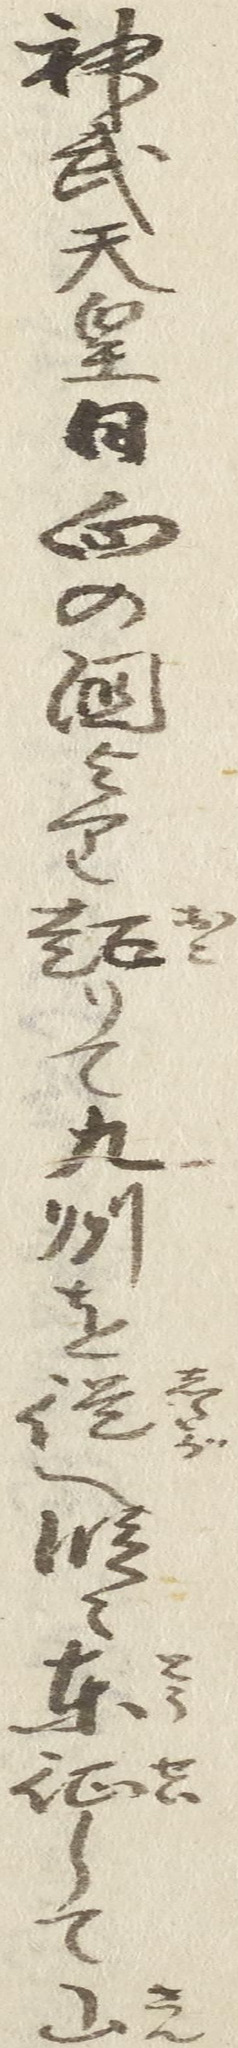神武天皇日向国より起りて九州を従へ段々東征して山
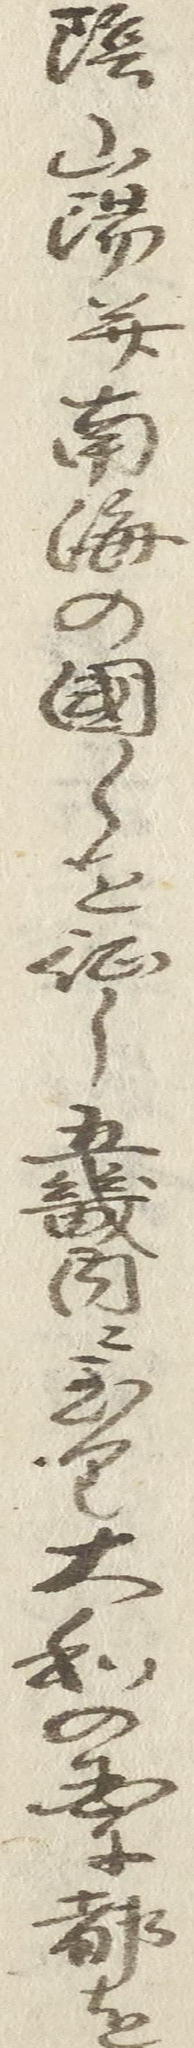陰山陽并南海の国々を征し五畿内に至り大和の国に都を
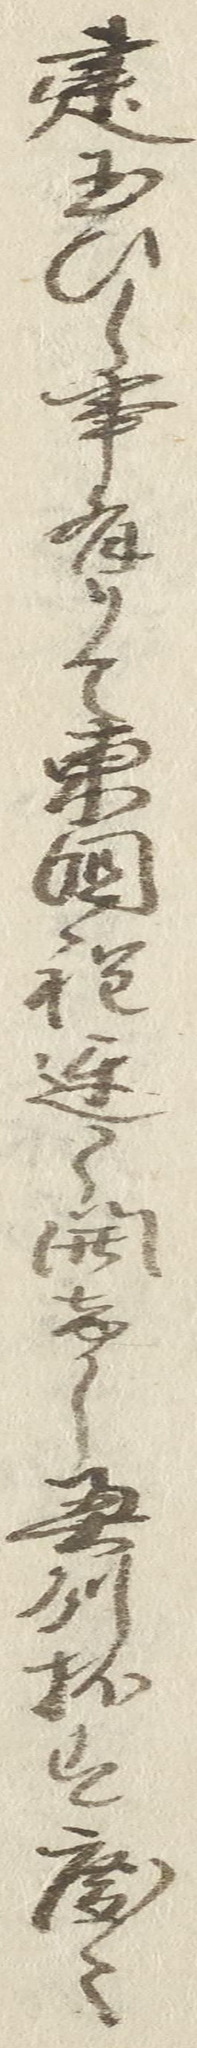建玉ひし事有りて東国程遅く開けし奥州抔は廣く
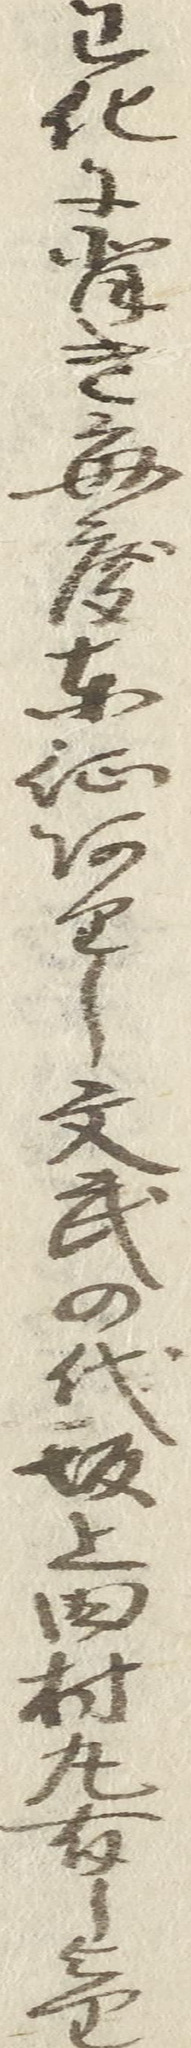王化に背き毎度東征ありし文武の代坂上田村丸有しより
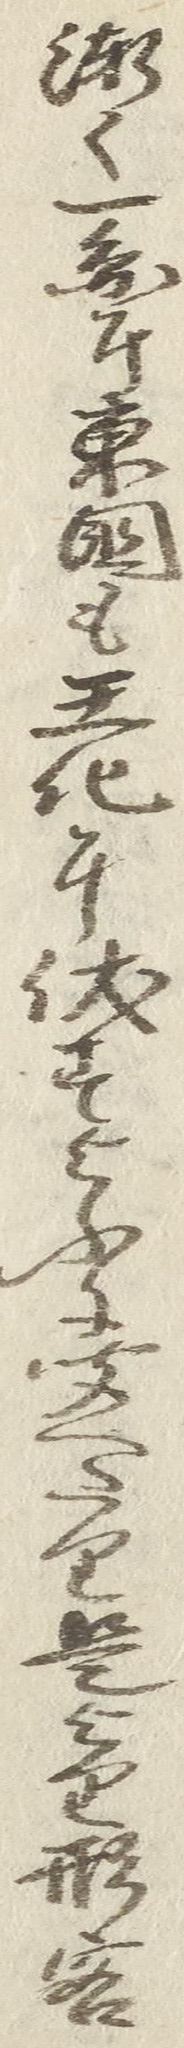漸く一円に東国も王化に伏すよゆに聞へたり是より形容
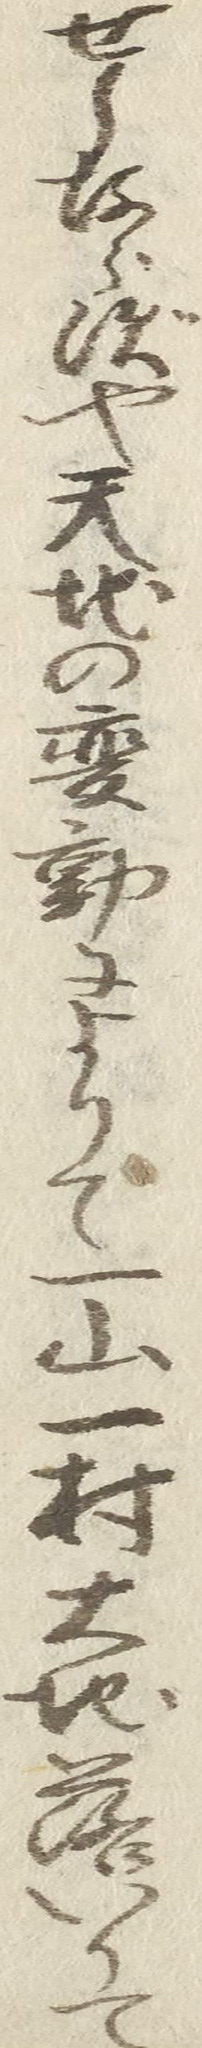せしならすや天地の変動によりて一山一村大地落いりて
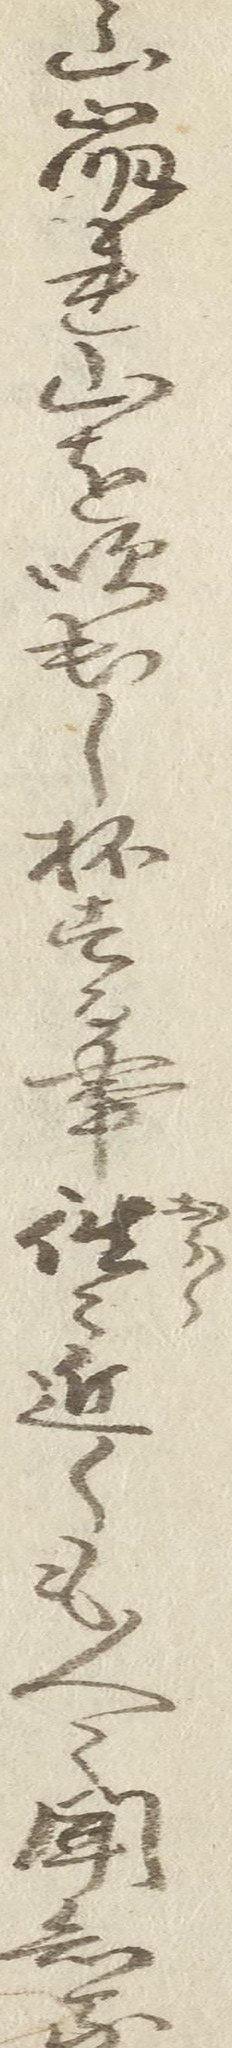山崩れ山を吹出し抔する事往々近くも人々聞知る

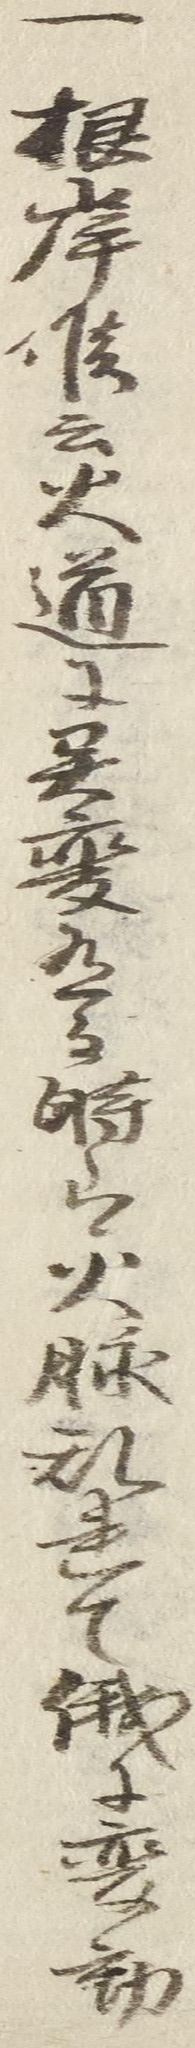一根岸侯云火道に異変有る時は火脈都駆れて俄に変動
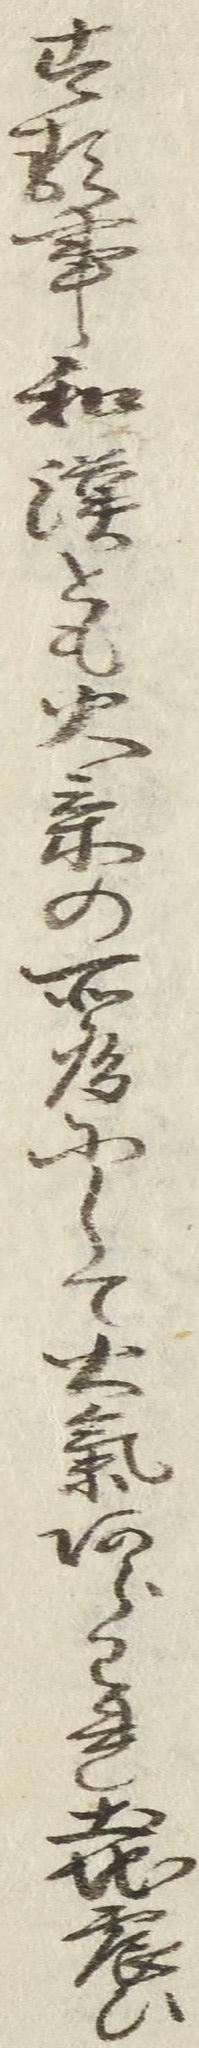する事和漢とも火気の所為にして火気あらわれ土地震ひ
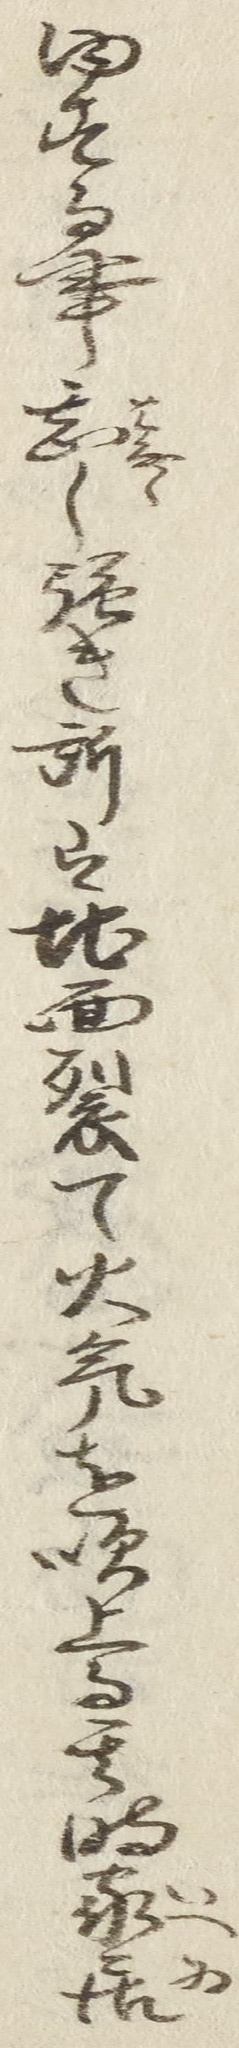ゆする事甚し強き所は地面裂て火気を吹上る其時家居
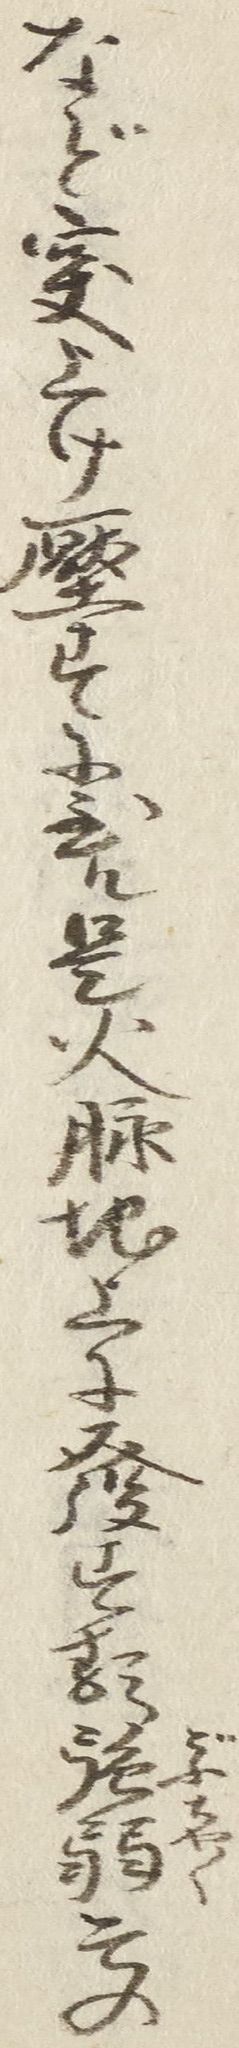など突上け壓すに至る是火脈地上に発する強弱その
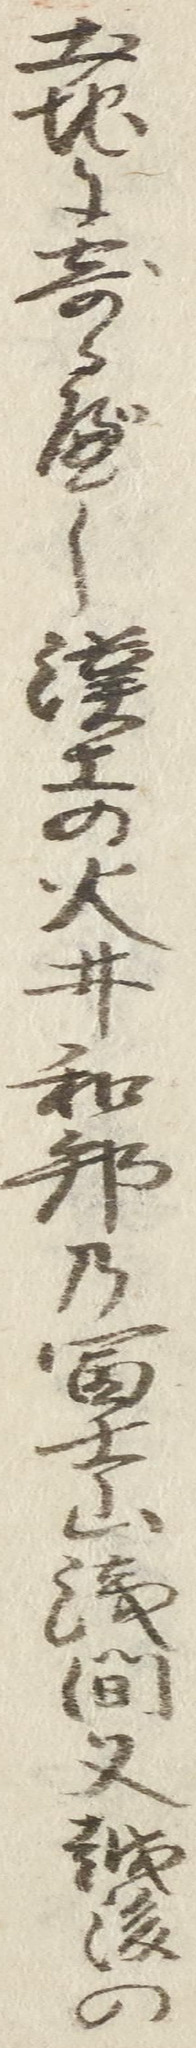土地に寄るべし韓土の火井和邦の富士山浅間又越後の
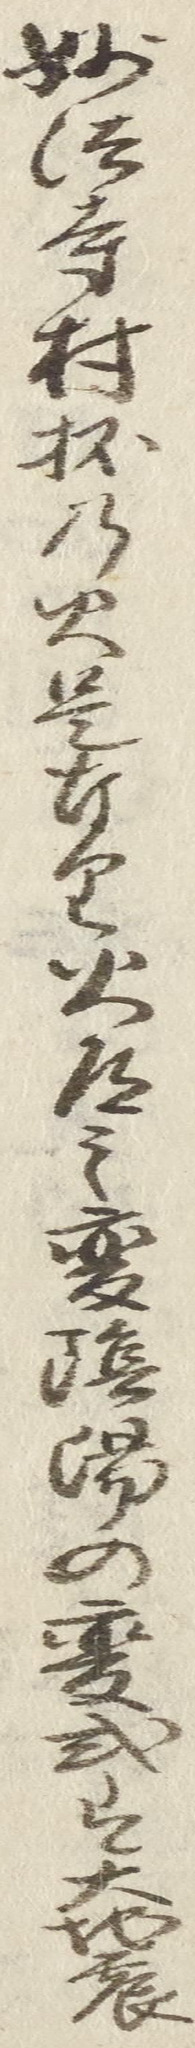妙法寺村抔の火是なり火道の変陰陽の変或は大地震
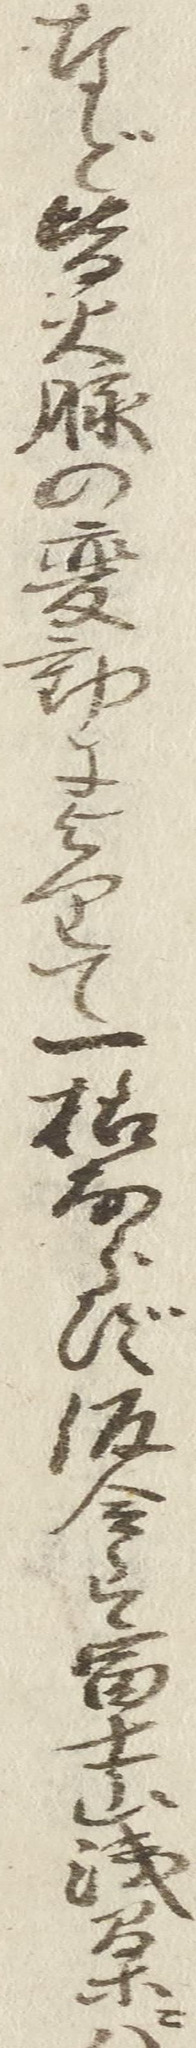など皆火脈の変動によりて一様ならず仮令は冨士山浅間等には
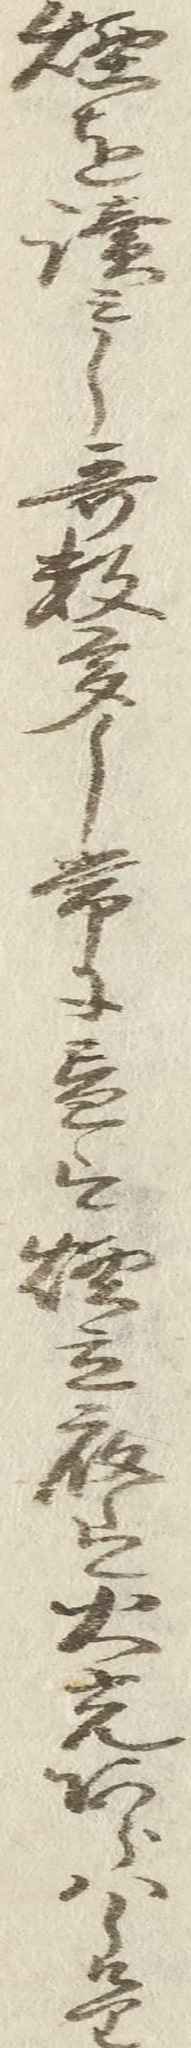煙を読みし哥数多し常に茲はは煙立夜は火元あらはしけり
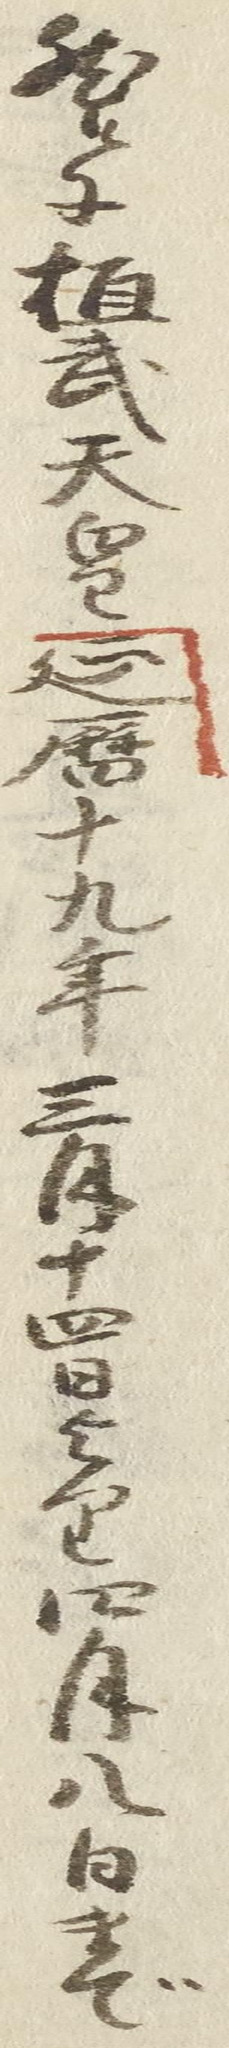然るに桓武天皇「応暦十九年三月十四日より四月八日まで
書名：従往古地震御届書記誌之一
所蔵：東京大学地震研究所図書室 Earthquake Research Institute Library, The University of Tokyo, JAPAN
